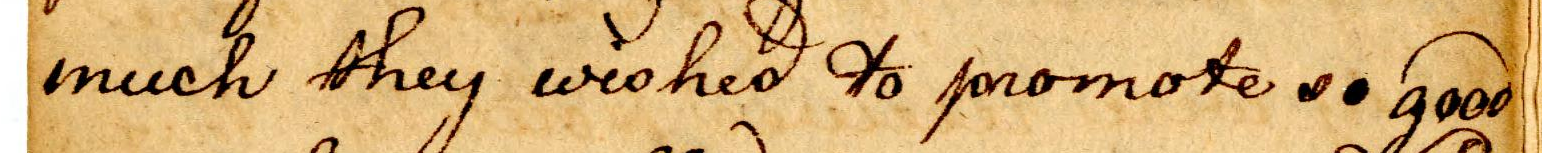much they wished to promote so good
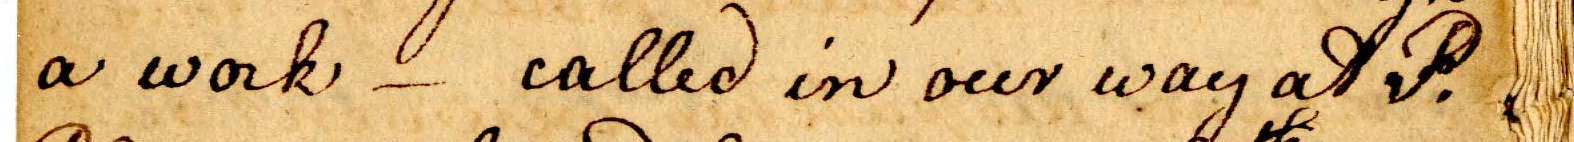a work- called in our way at P.
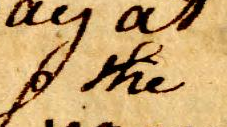the
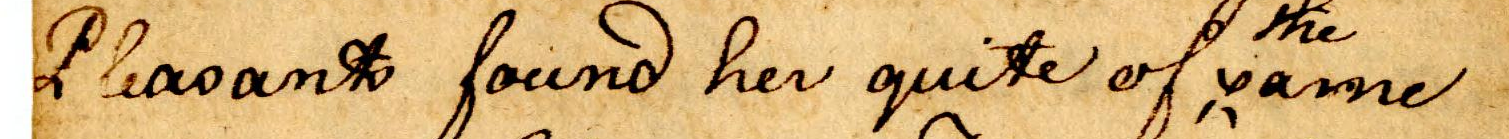Pleasants found her quite of same
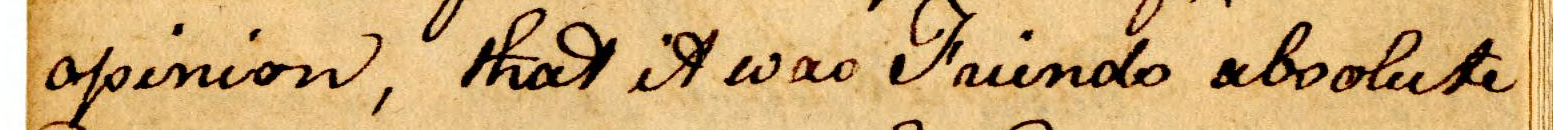opinion, that it was Friends absolute
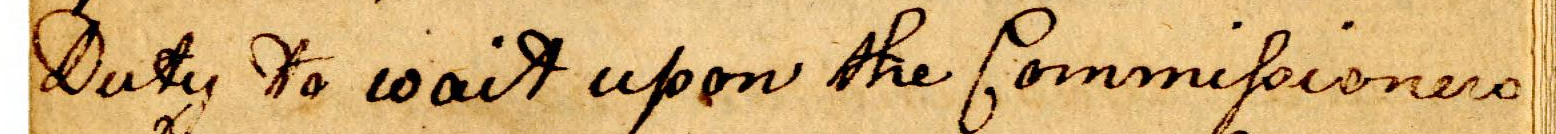Duty to wait upon the Commissioners
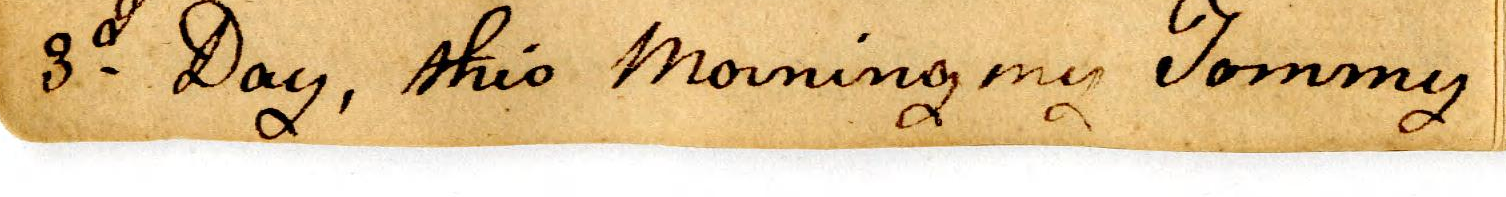3^d. Day, this Morning my Tommy
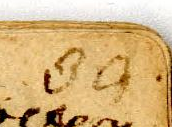39
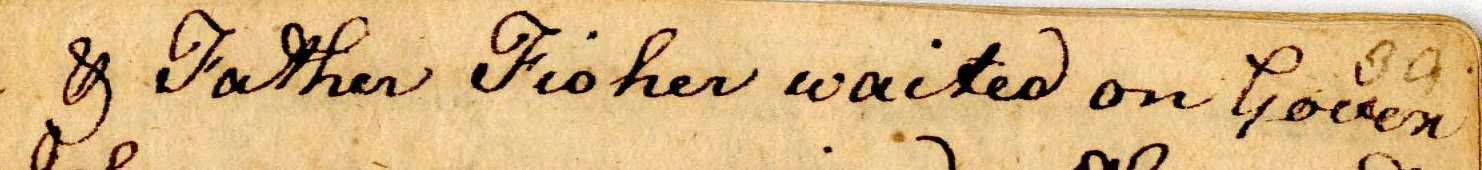& Father Fisher waited on Govern
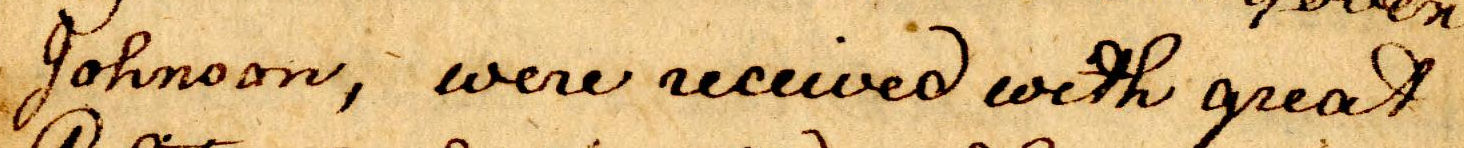Johnoon, were received with great
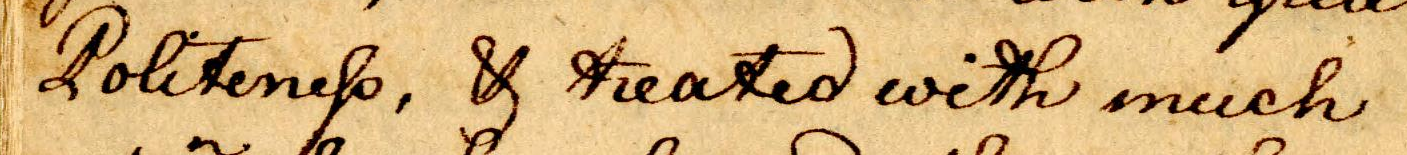Politeness, & treated with much
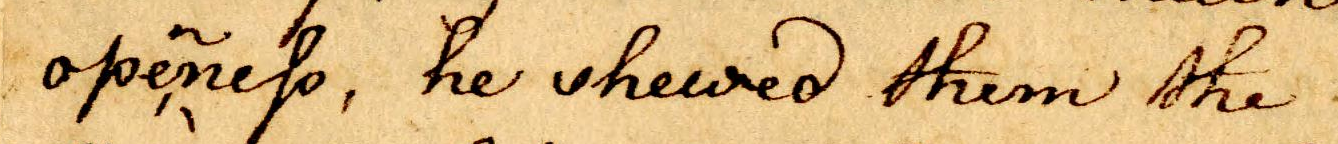ope ^n ness, he shewed them the
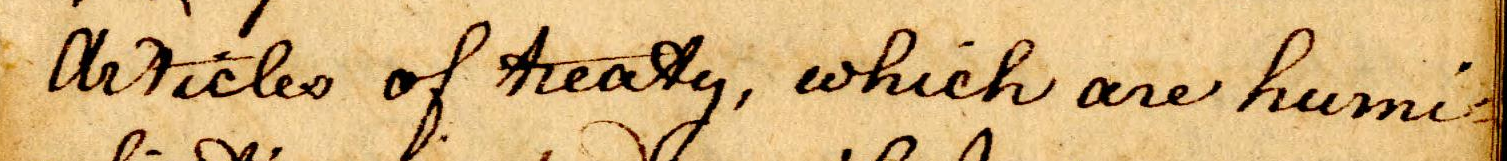Articles of treaty, which are humi-
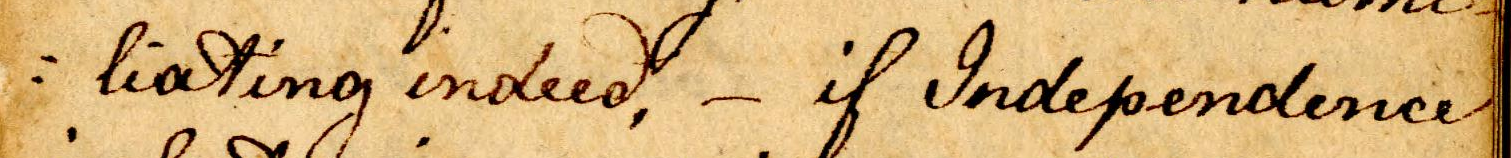-liating indeed- if Independence
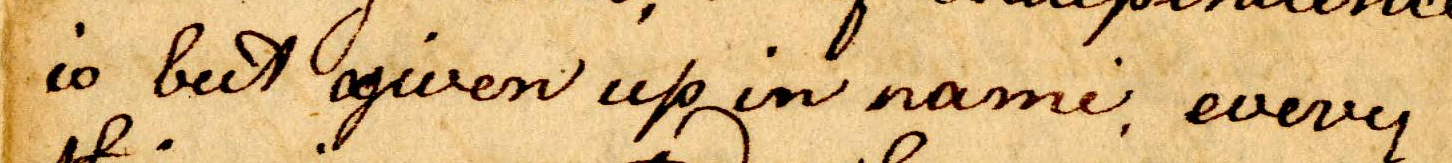is but given us in name, every
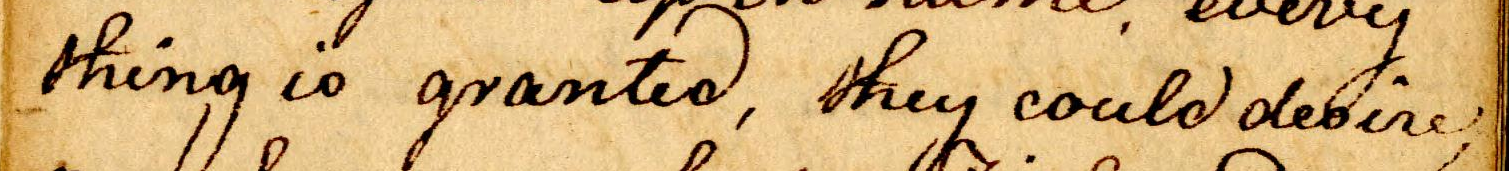thing is granted, they could desire,
